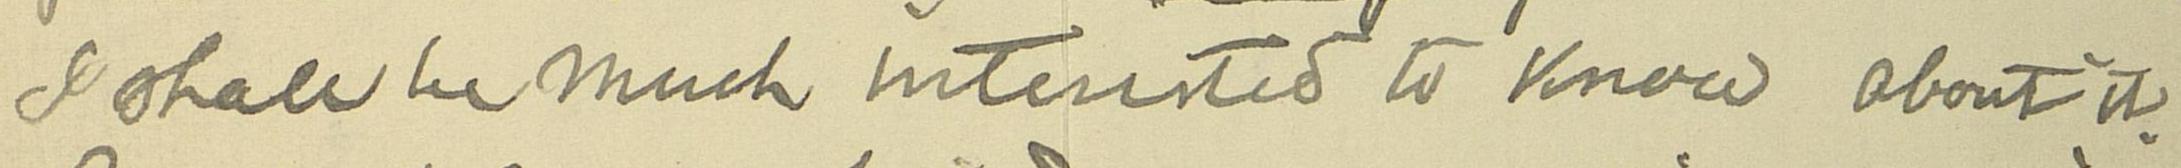I shall be much interested to know about it.
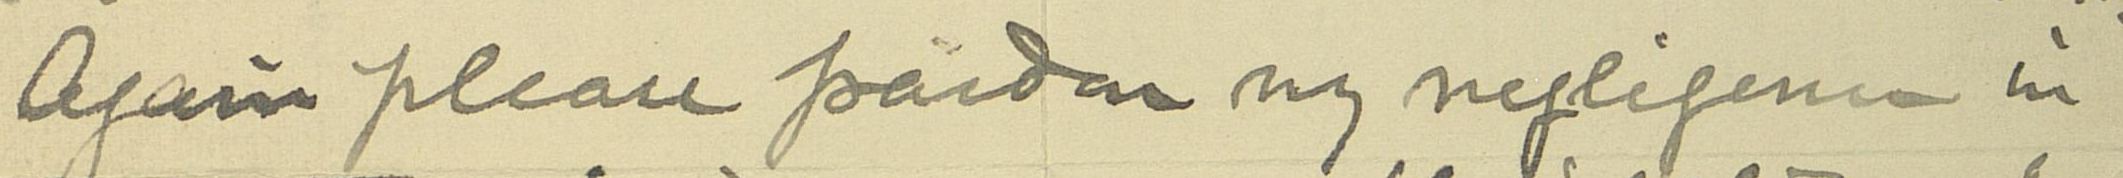Again please pardon my negligence in
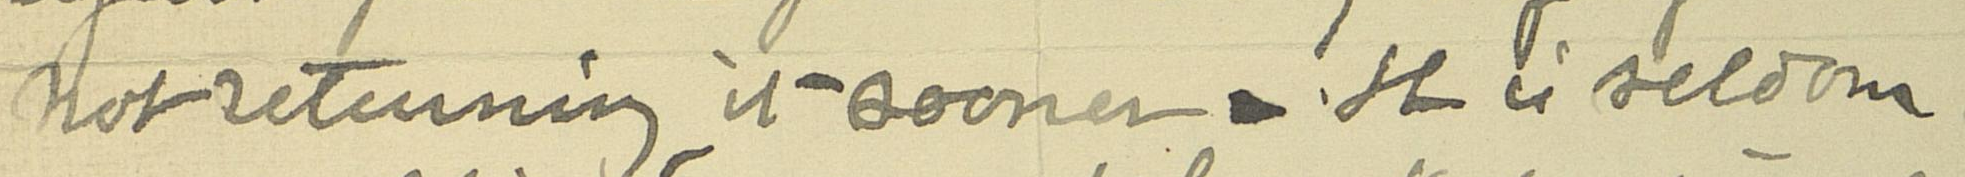not returning it sooner. It is seldom
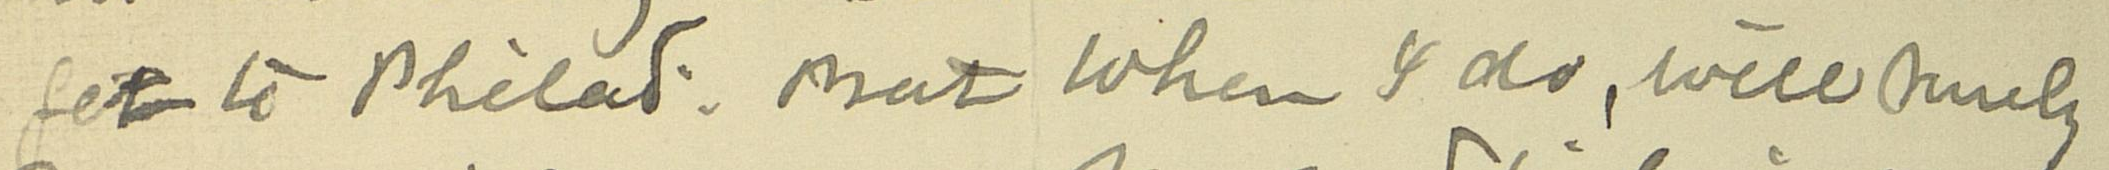set to Philad. but when I do, will surely
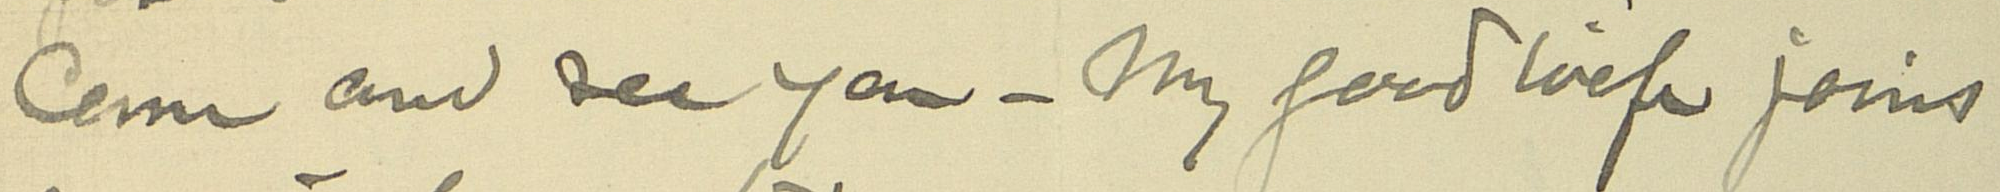Come and see you. My good wife joins
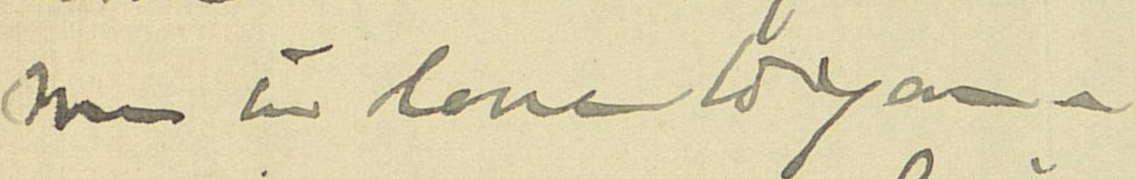me in love to you.
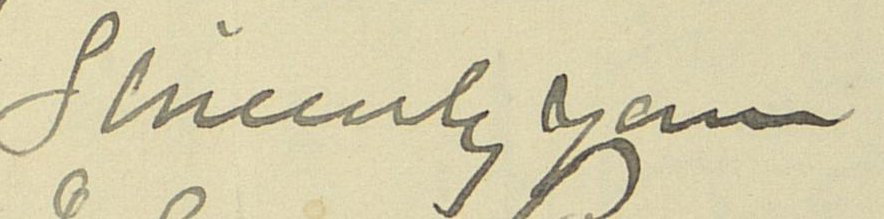Sincerely your
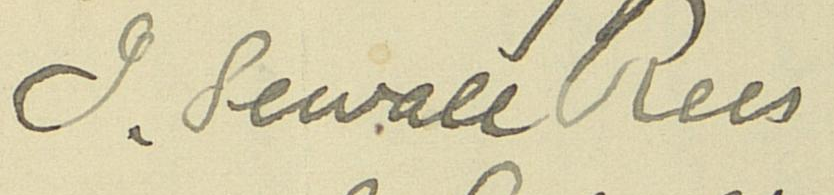J. Sewall Rees
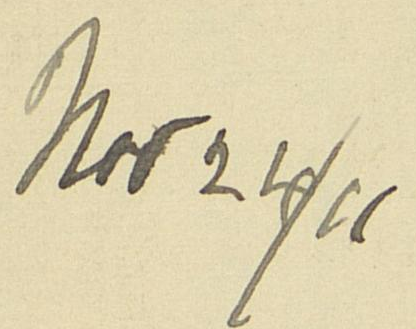Nov 24/11
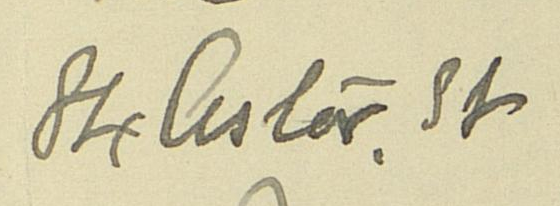84 Astor St
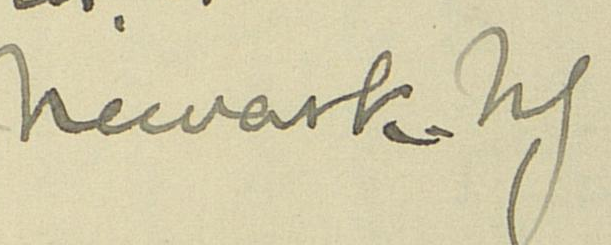Newark, NJ
